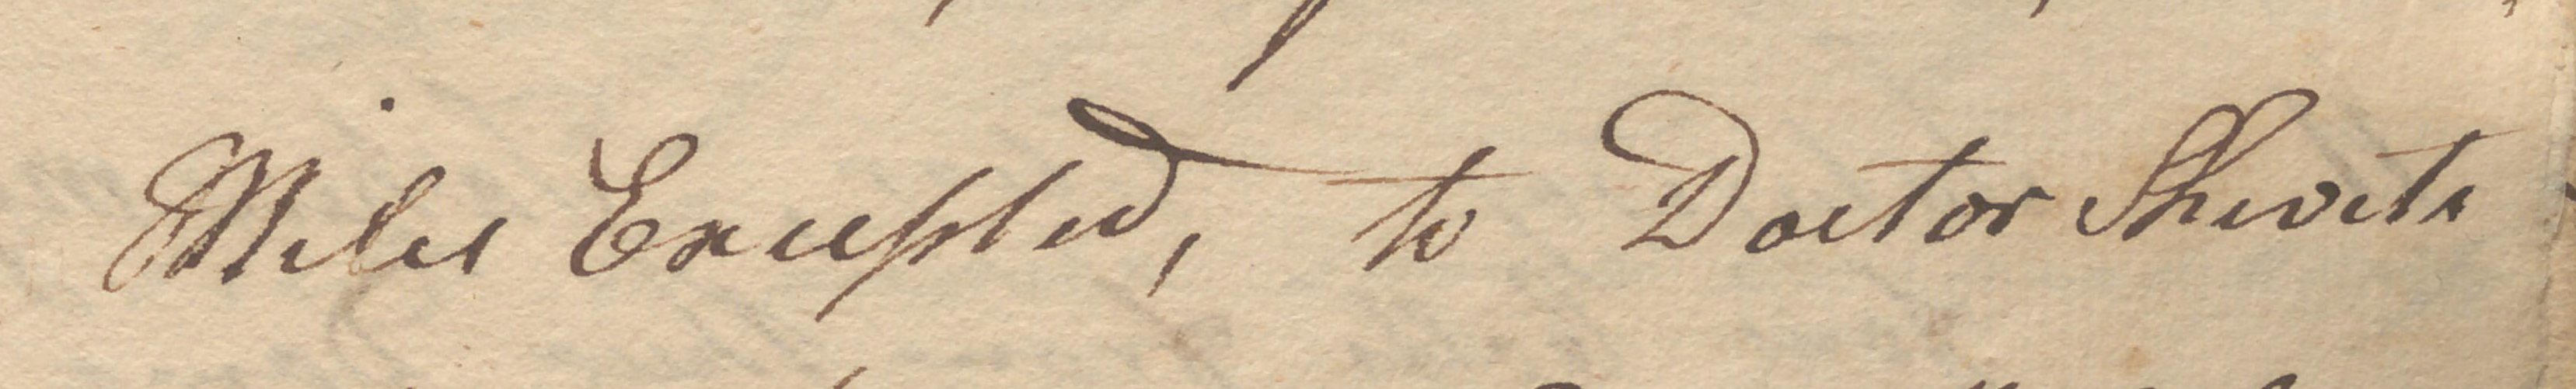Miles Excepled, to Doctor Shivets
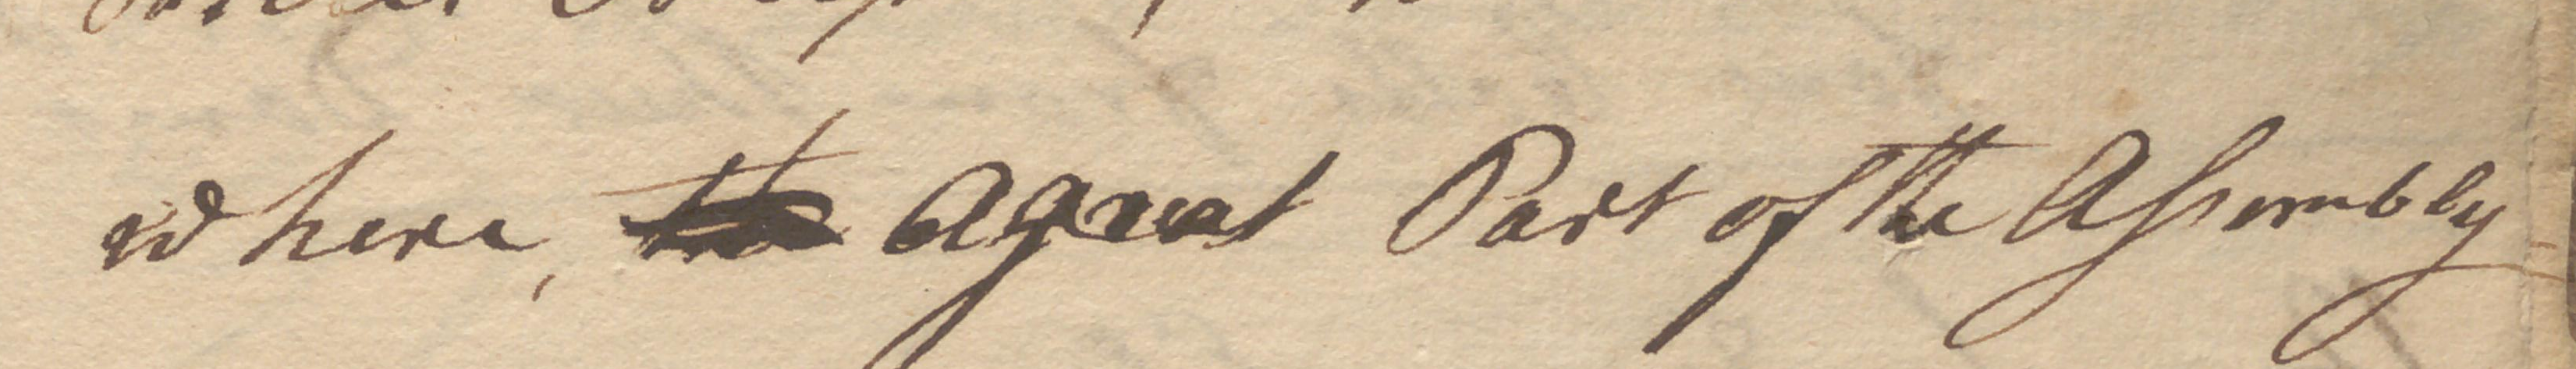where [th] a great Part of the Assembly
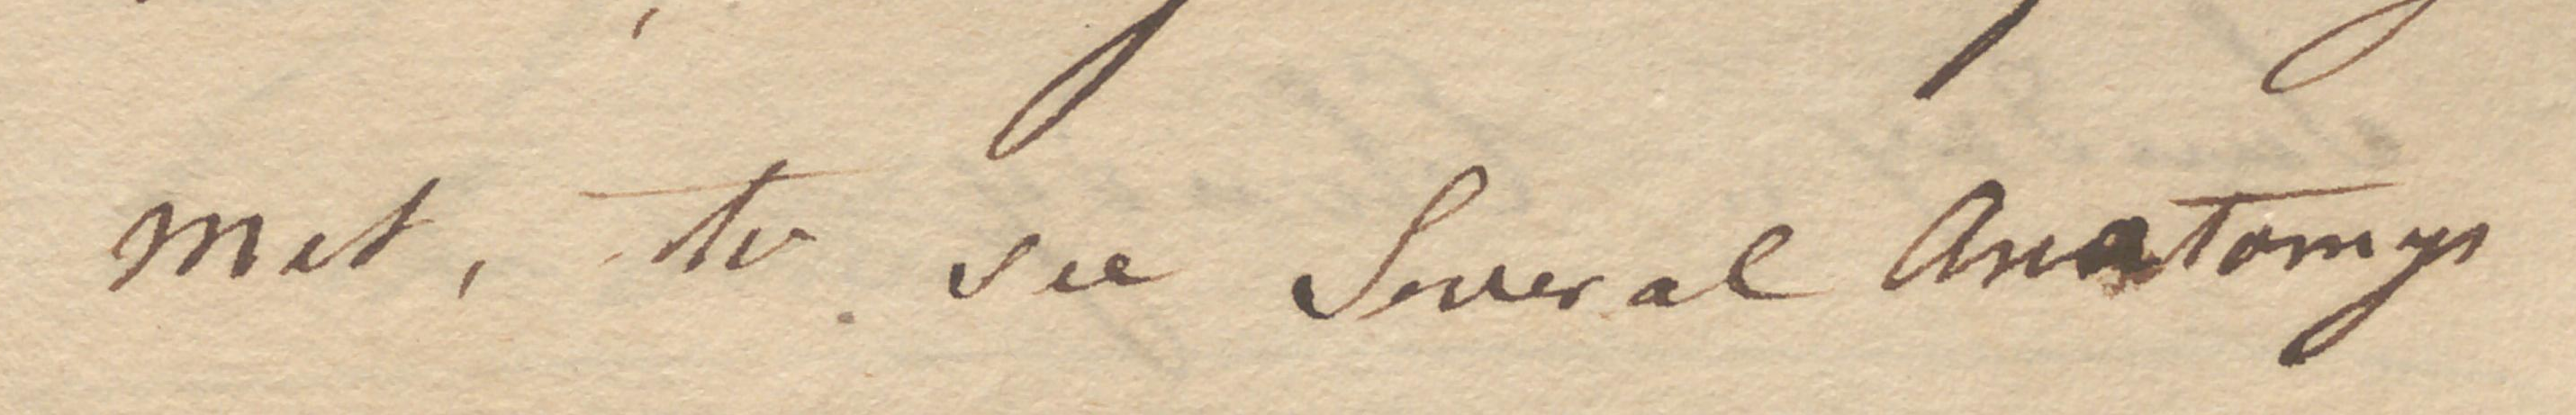met, to see Several Anatomys
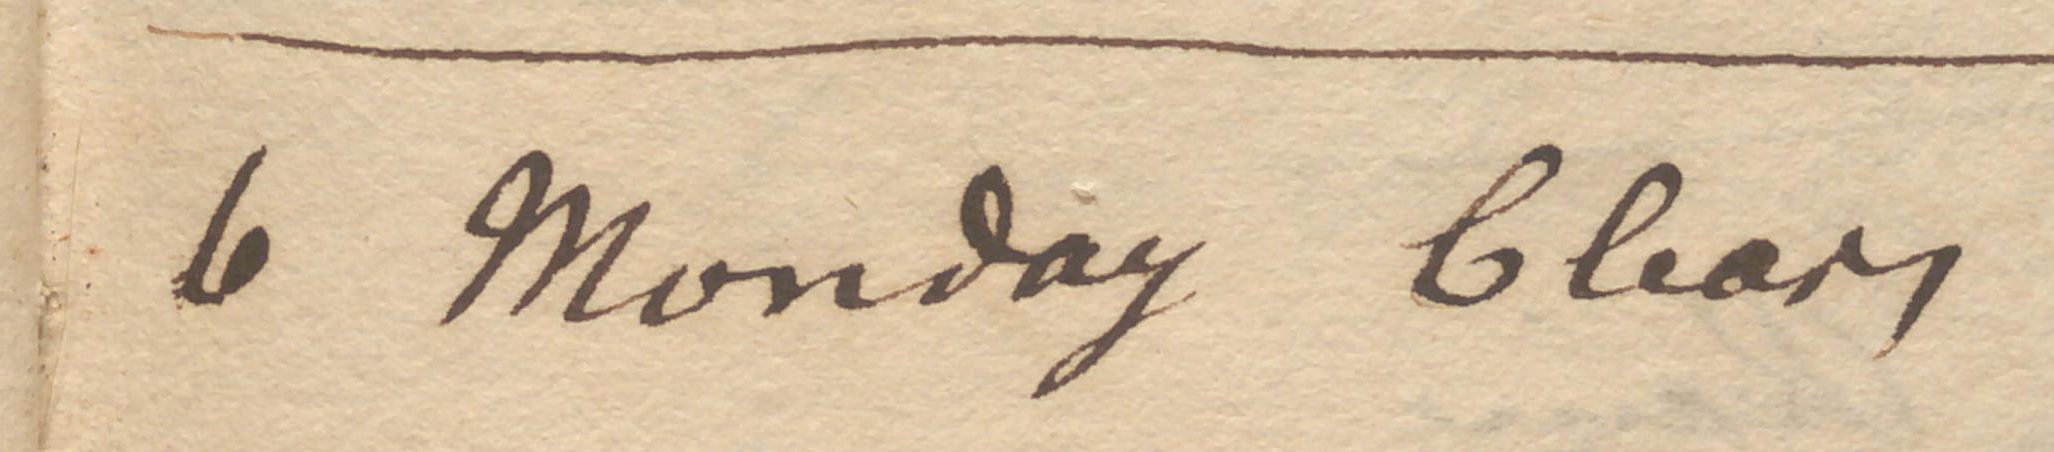6 Monday Clear
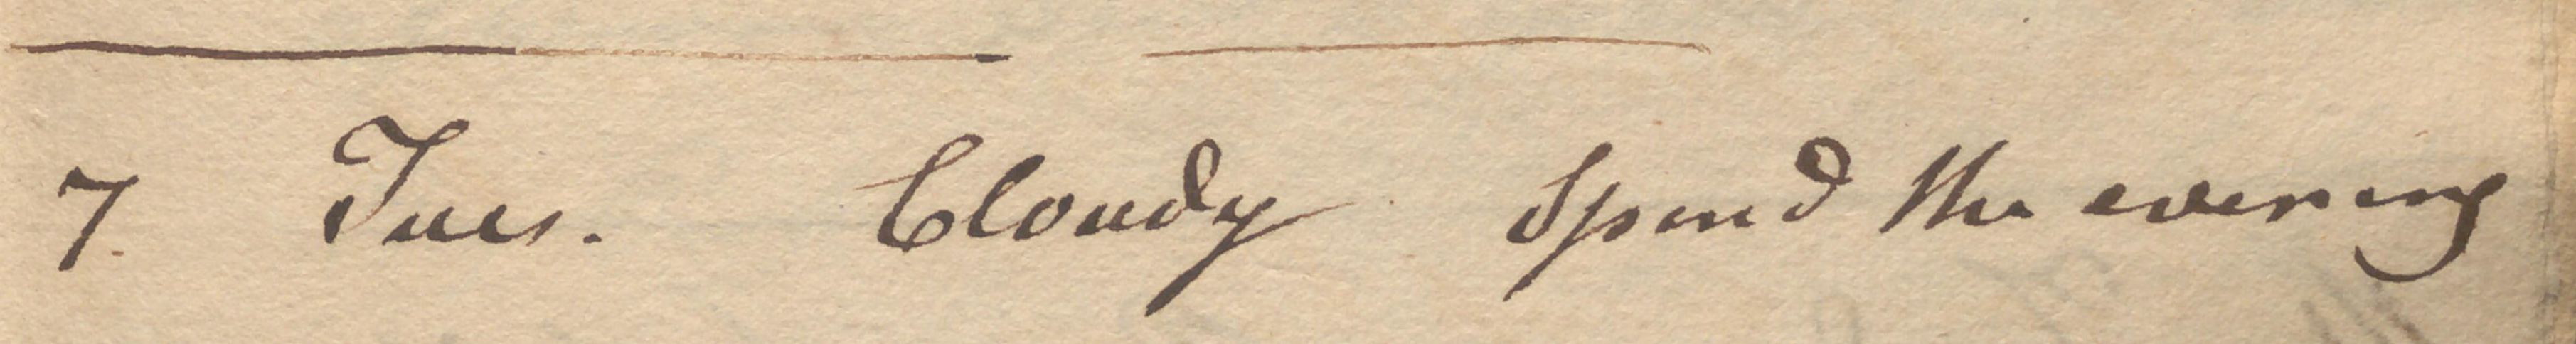7. Tues. Cloudy spend the evening
